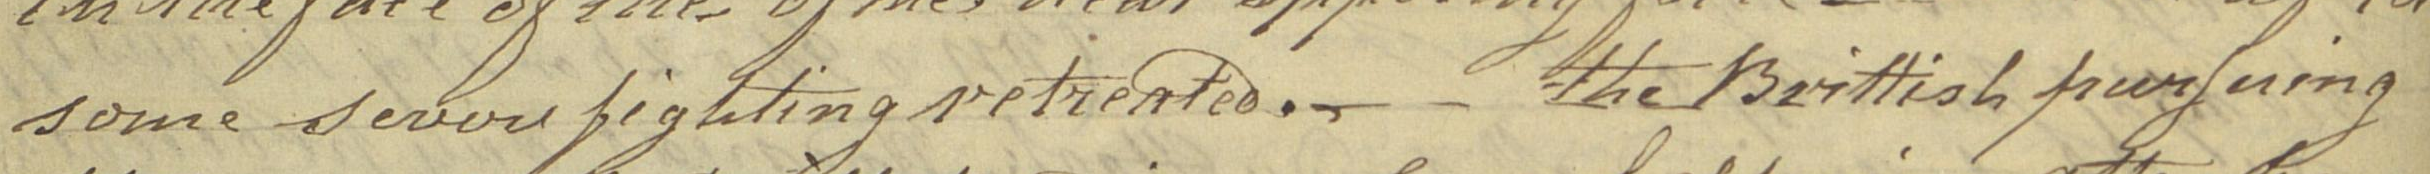some severe fighting retreated. The Brittish pursuing
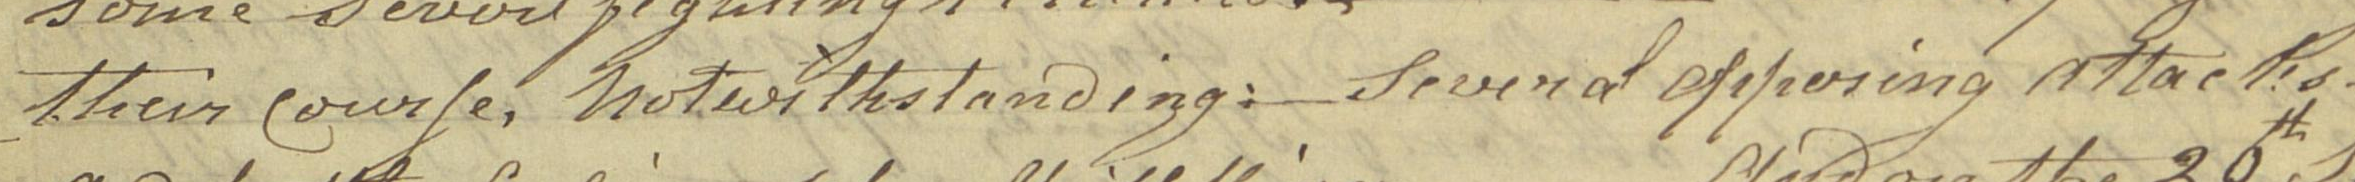their course, notwithstanding: Several opposing attacks
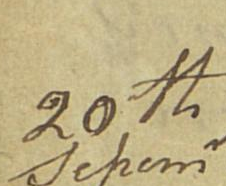20th
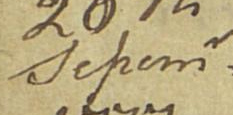Sepem^r
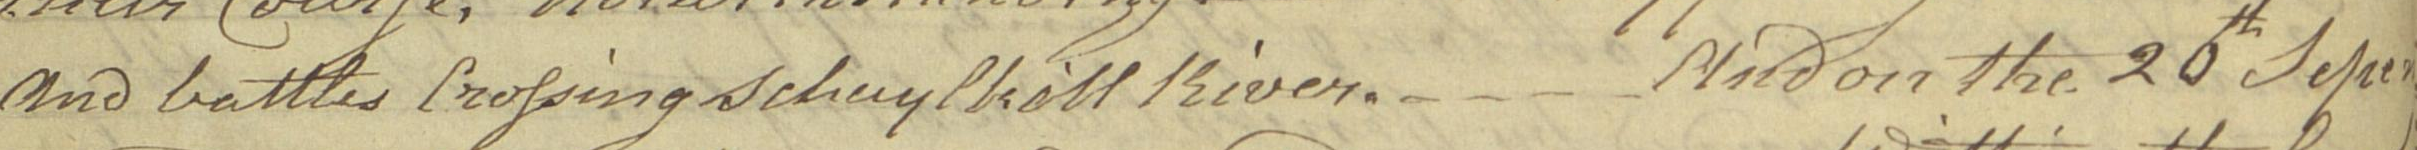and battles Crossing Schuylkill River. And on the 20^th Sepe-
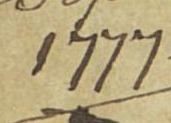1777
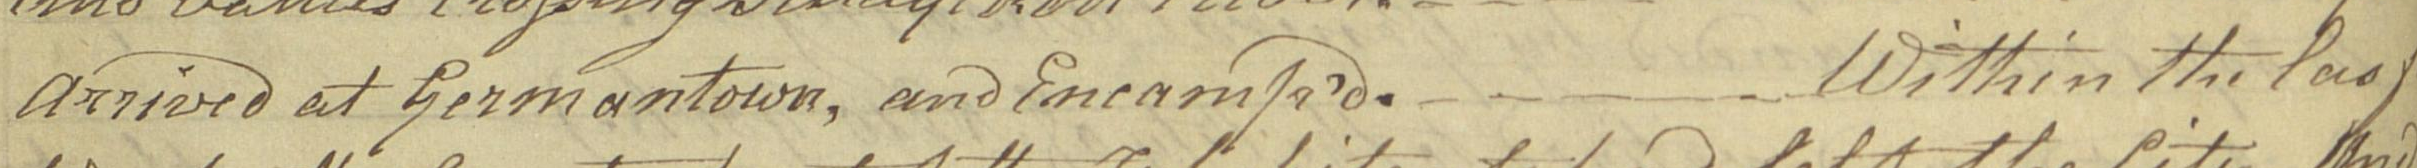Arrived at Germantown, and Encamp'd. Within the las-
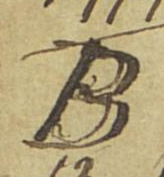B
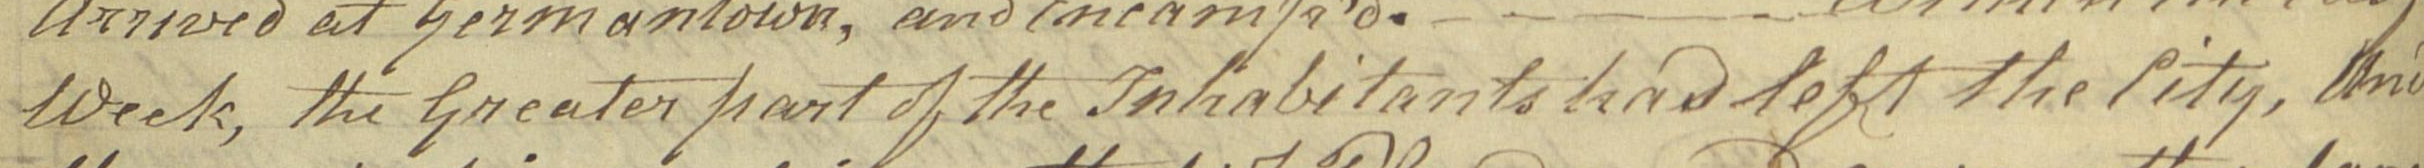week, the Greater part of the Inhabitants had left the City, And
